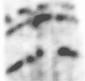王
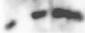一
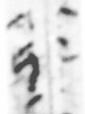𨍱（乘）
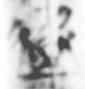○（路）
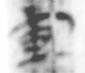車
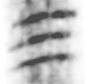三
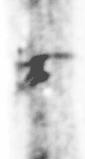匹
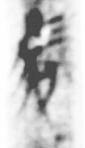駟
